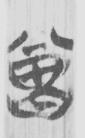曾
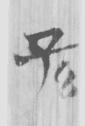孫
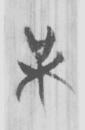某
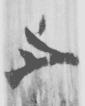之
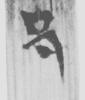邑
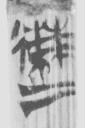速
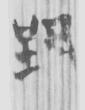郢
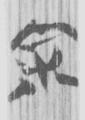余
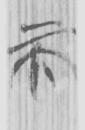而
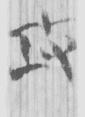攻
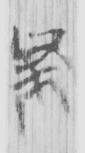布
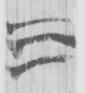三
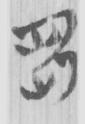芻
